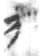夫
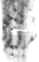逃
